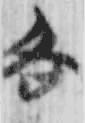各
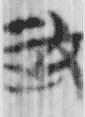政
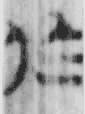於
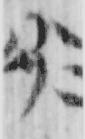小人
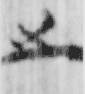之
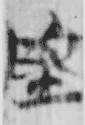○（地）
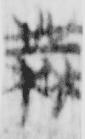無
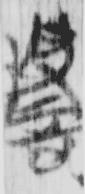諍（爭）
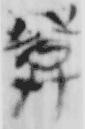登
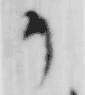人
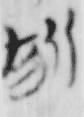所
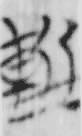漸
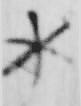木
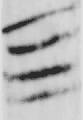四
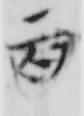百
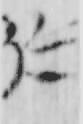於
